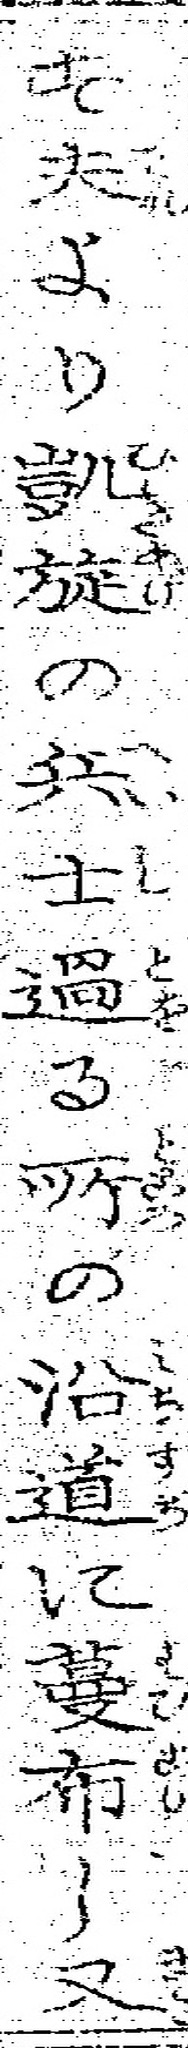す夫より凱旋の兵士過る所の沿道に蔓布し又
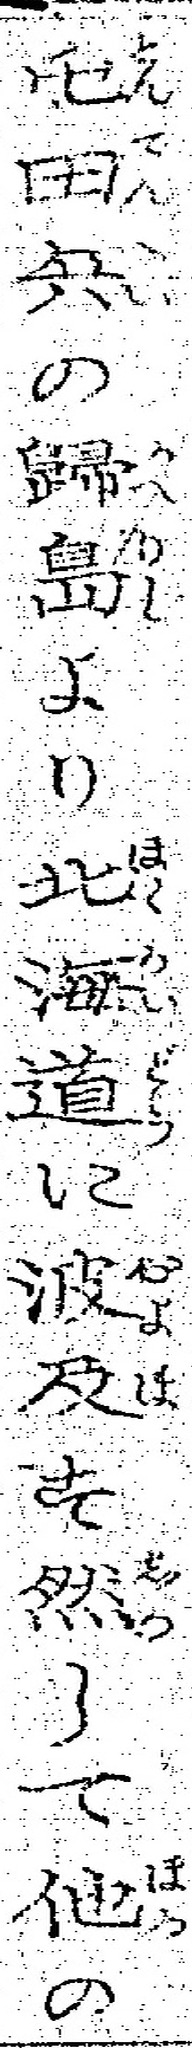屯田兵の帰島より北海道に波及す然して他の
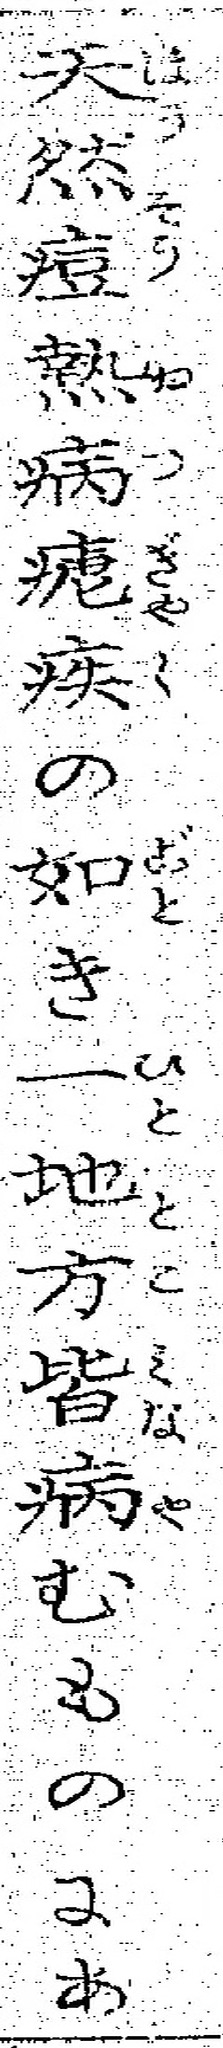天然痘熱病瘧疾の如き一地方皆病むものにあ
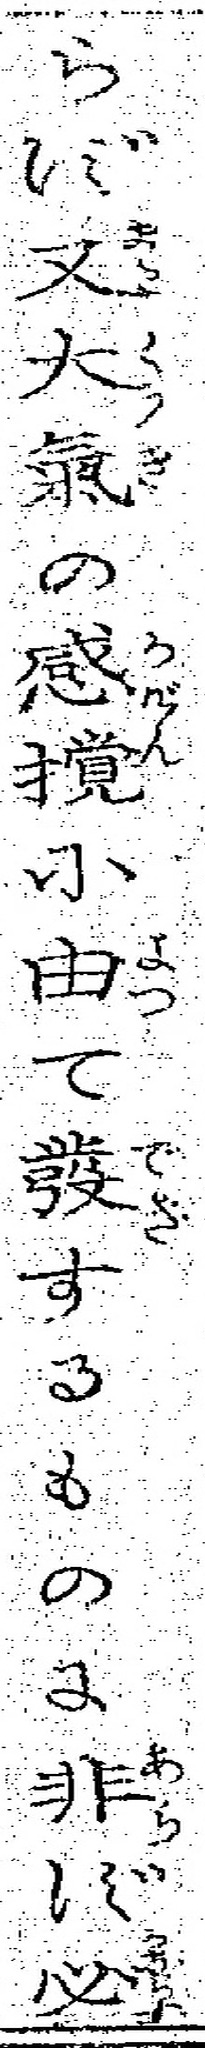らず又大気の感撹に由て発するものに非ず必
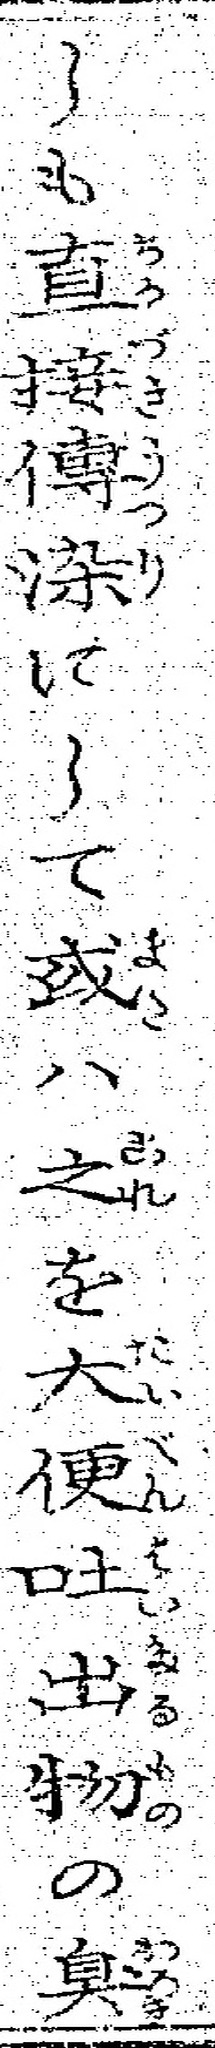しも直接傅染にして或は之を大便吐出物の臭
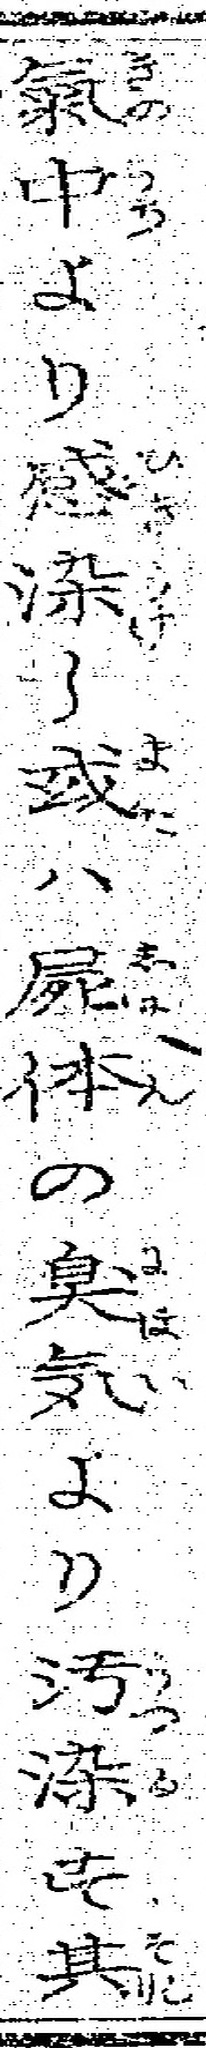気中より感染し或は屍体の臭気より汚染す其
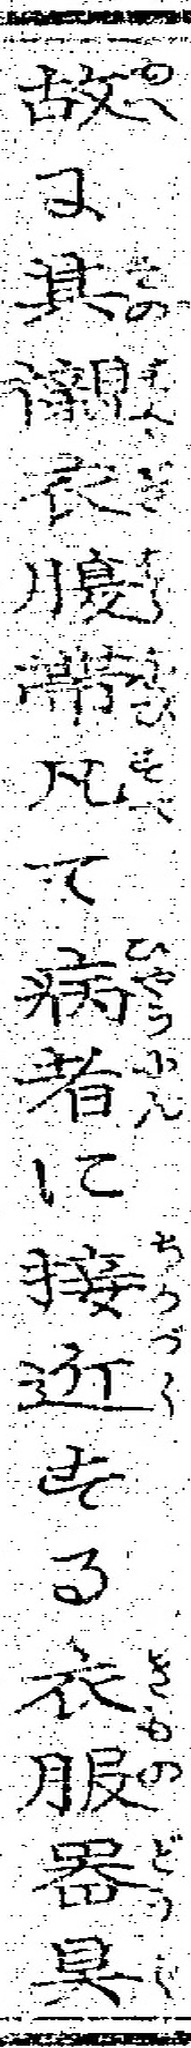故に其襯衣腹帯凡て病者に接近する衣服器具
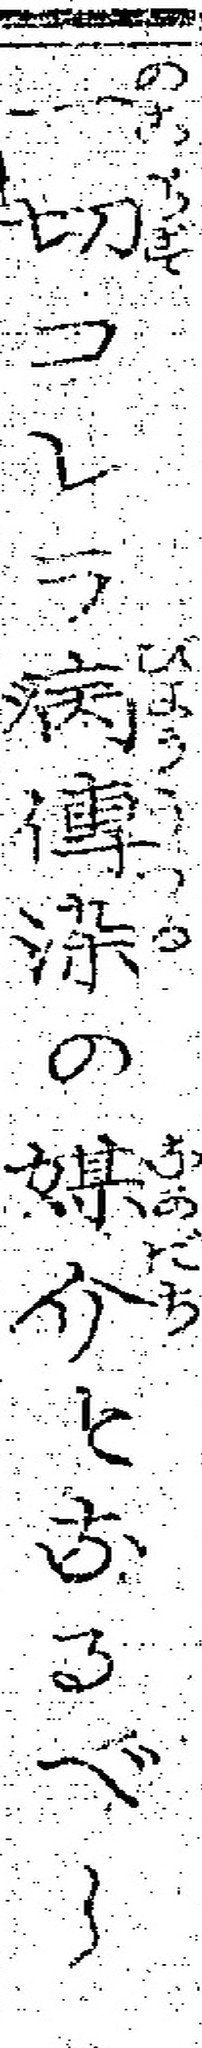一切コレラ病傅染の媒介となるべし
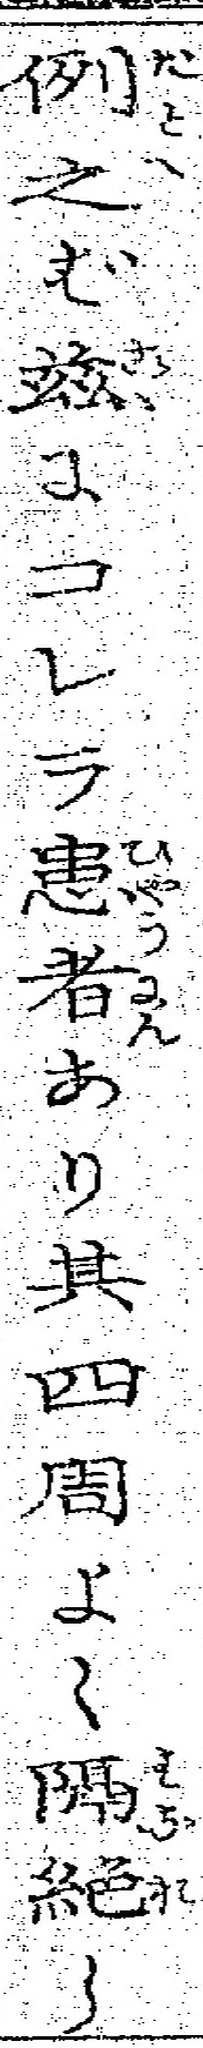例之ば茲にコレラ患者あり其四周よく隔絶し
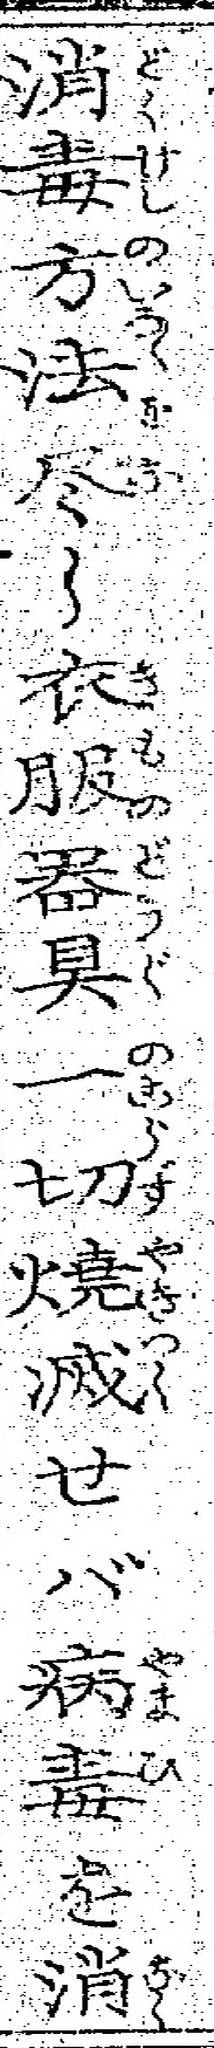消毒方法尽し衣服器具一切焼滅せば病毒を消

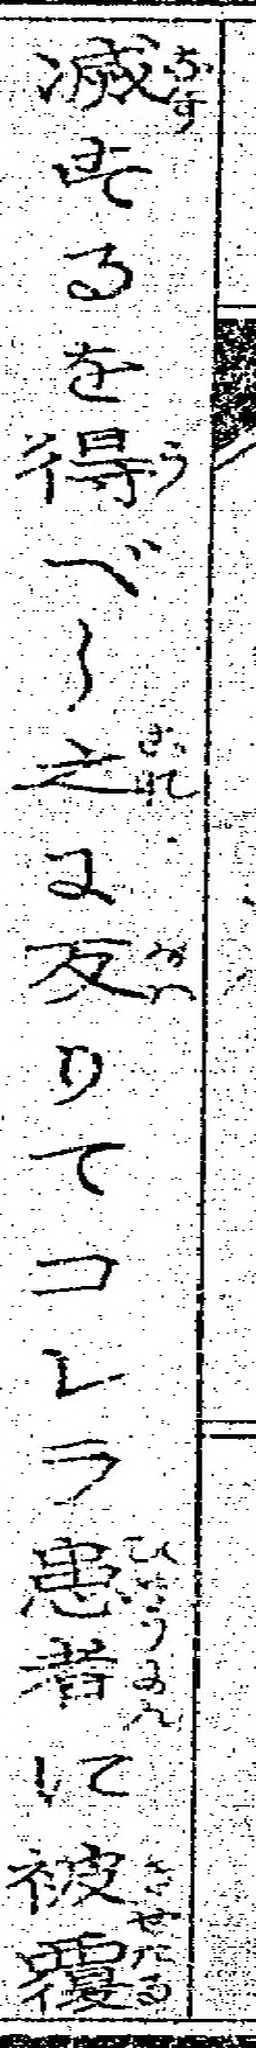滅するを得べし之に反りてコレラ患者に被覆
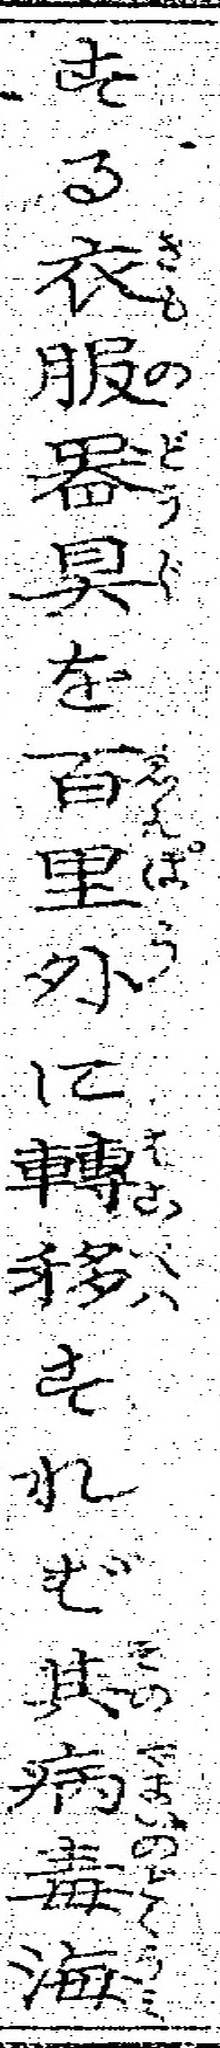るす衣服器具を百里外に轉移すれば其病毒海
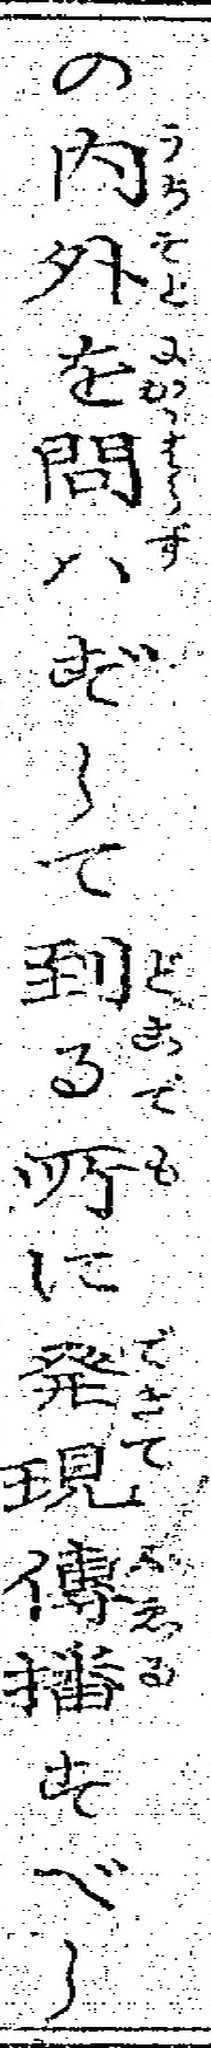の内外を問はずして到る所に発現傳播すべし
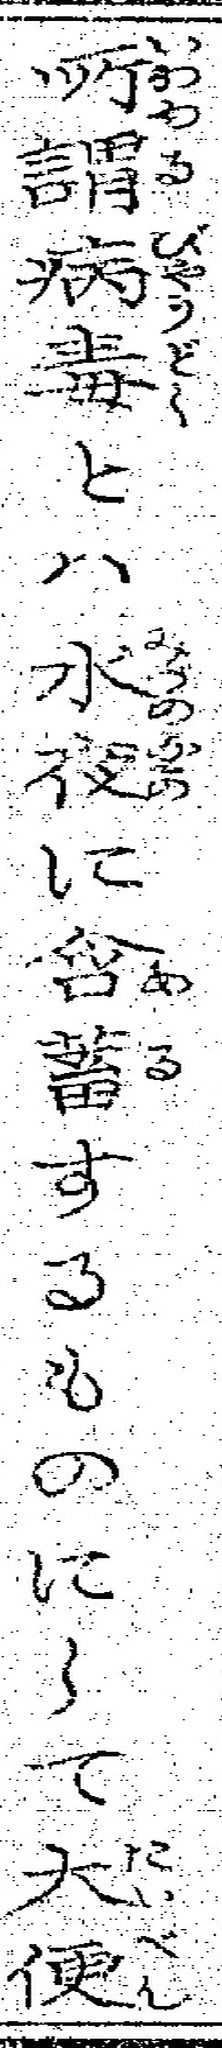所謂病毒とは水液に含蓄するものにして大便
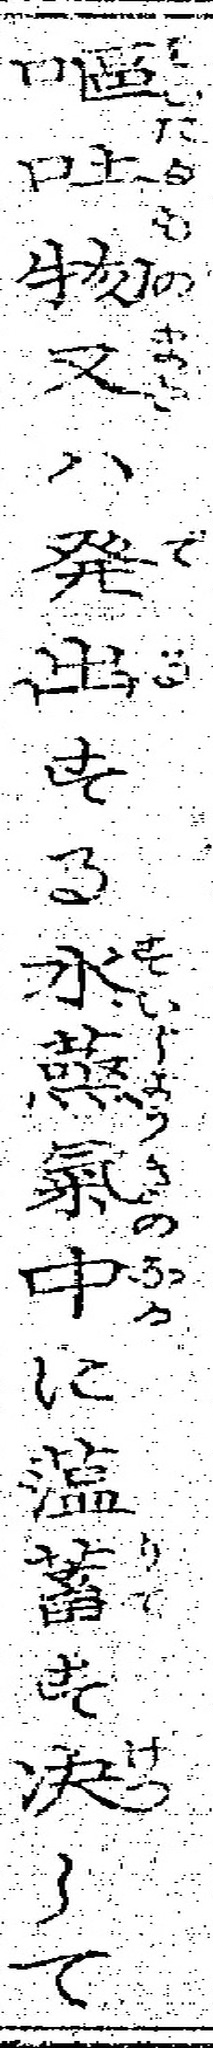嘔吐物又は発出する水蒸気中に畜す決して
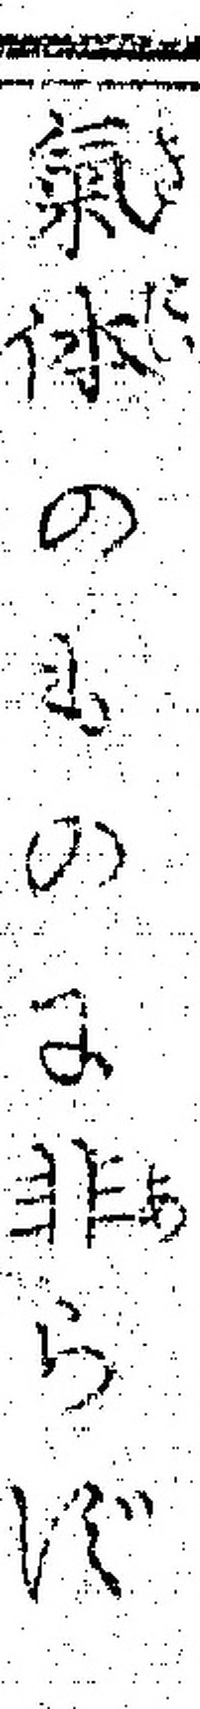気体のものに非らず
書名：虎列剌予防民間の心得
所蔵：国立国会図書館 National Diet Library, JAPAN
